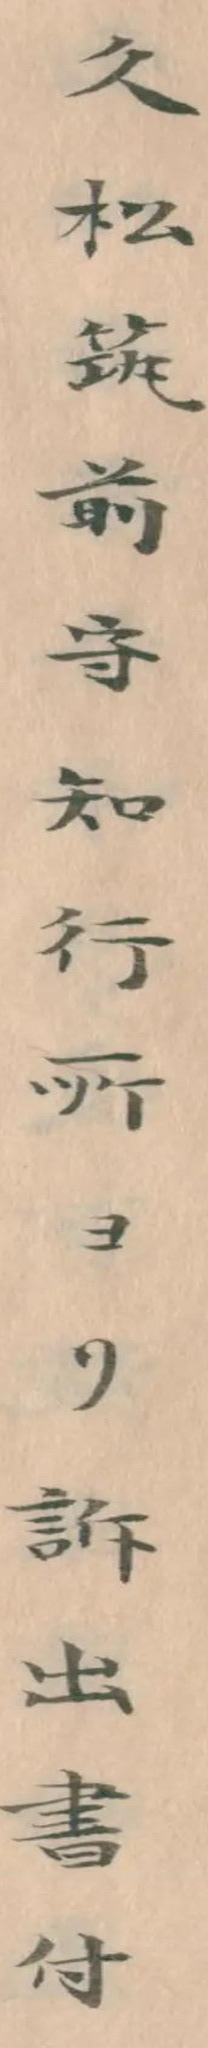久松筑前守知行所ヨリ訴出書付
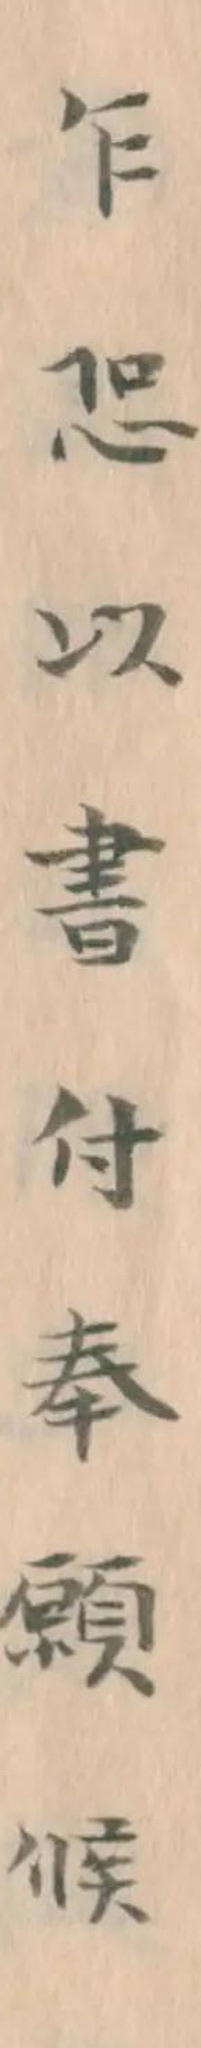乍恐以書付奉願候

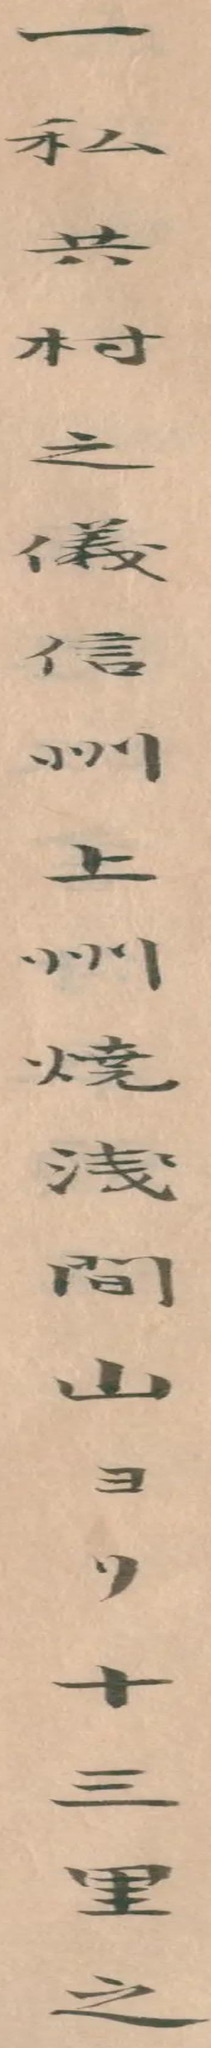一私共村之儀信州上州焼浅間山ヨリ十三里之
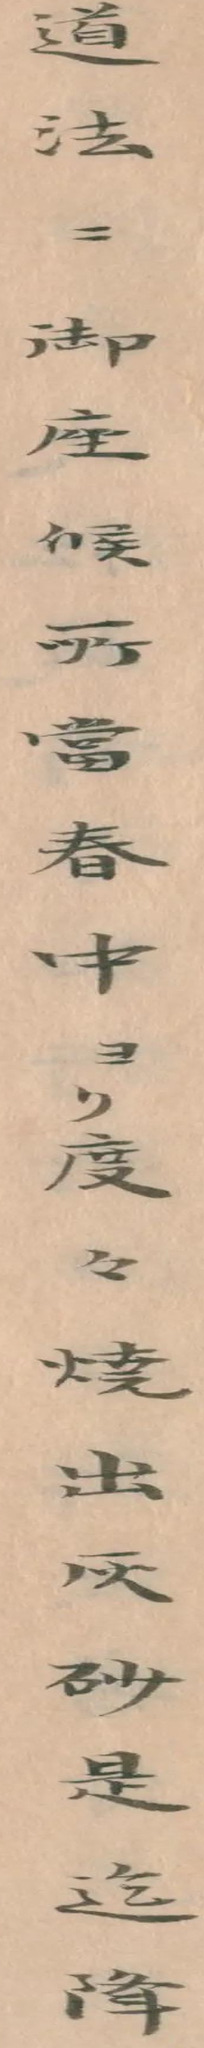道法二御座候所当春中ヨリ度々焼出灰砂是迄降
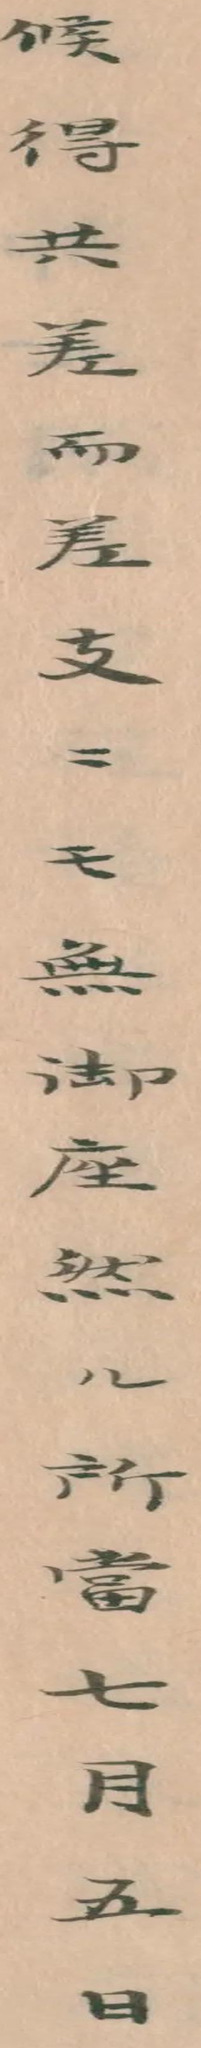候得共差而差支ニモ無御座然ル所当七月五日
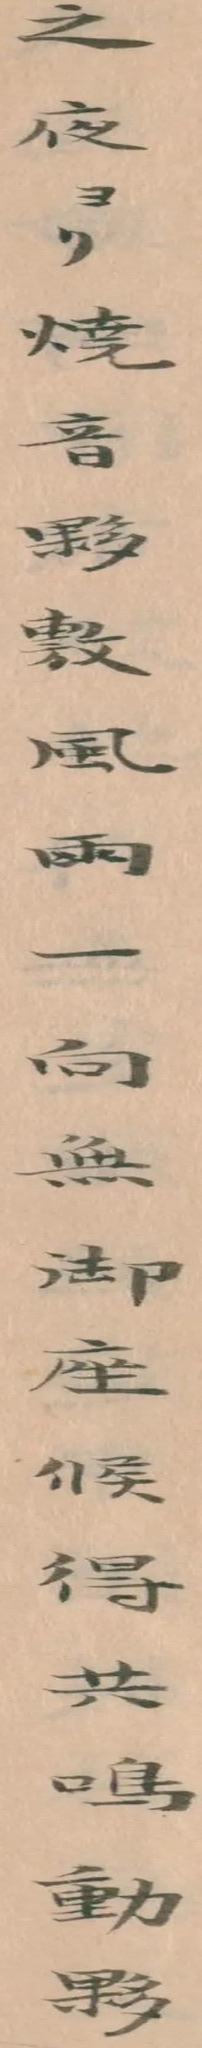之夜ヨリ焼音夥敷風両一向無御座候得共鳴動夥
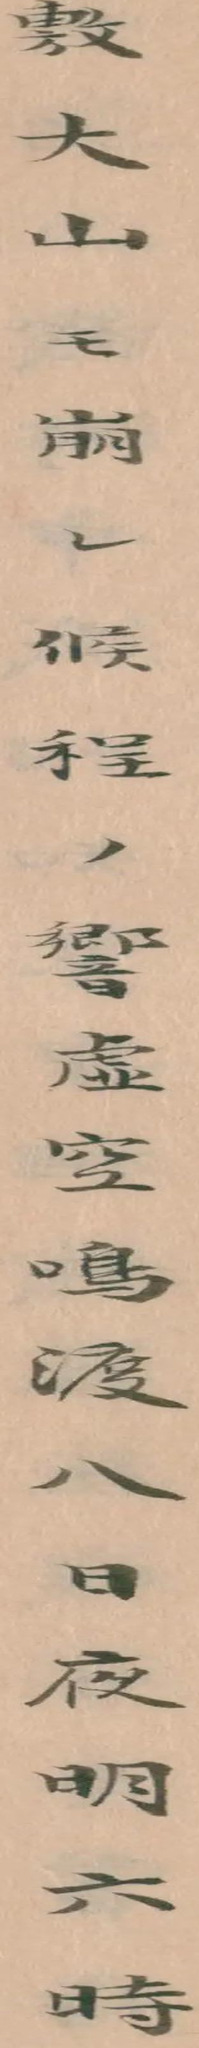敷大山モ崩レ候程ノ響虚空鳴渡八日夜明六時
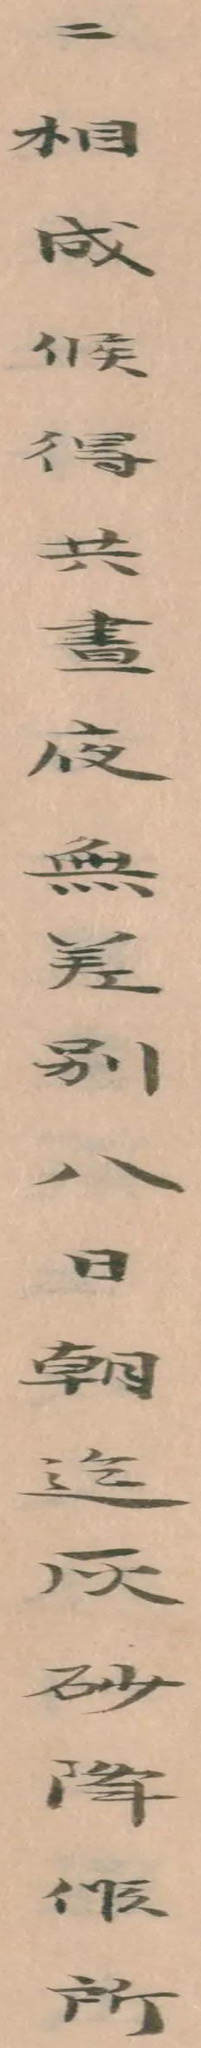二相成候得共晝夜無差別八日朝迄灰砂降候所
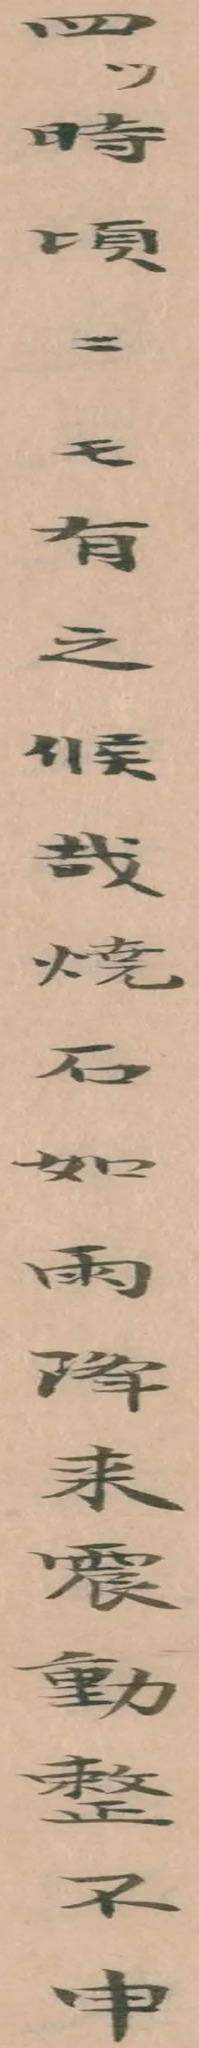四ッ時頃ニモ有之候哉焼石如雨降来震動整不申
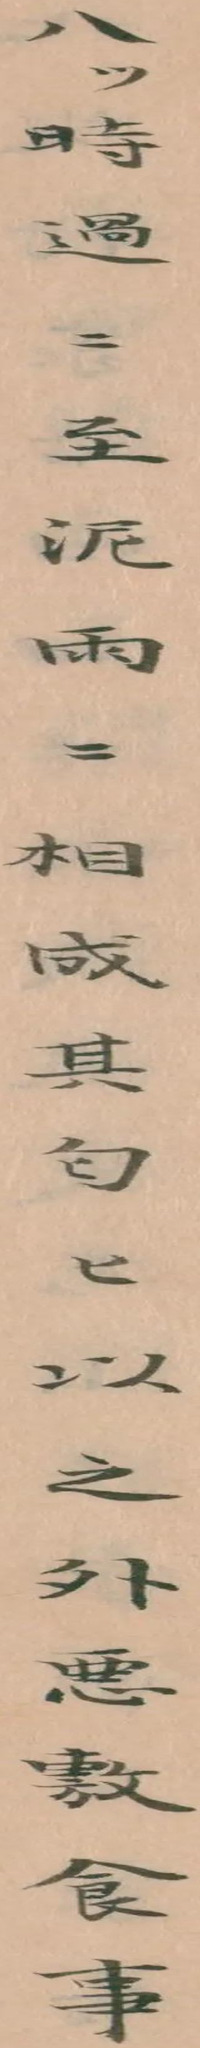八ッ時過二至泥雨二相成其匂ヒ以之外悪敷食事
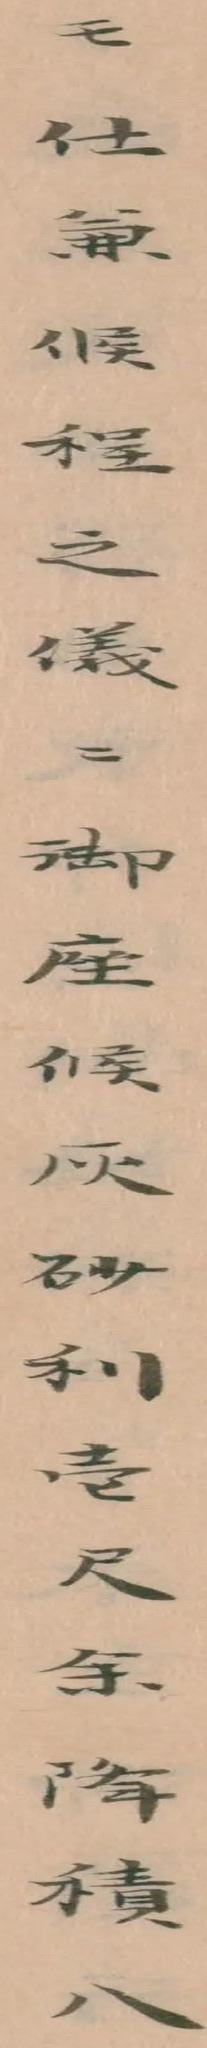モ仕兼候程之儀二御座候灰砂利壱尺余降積八
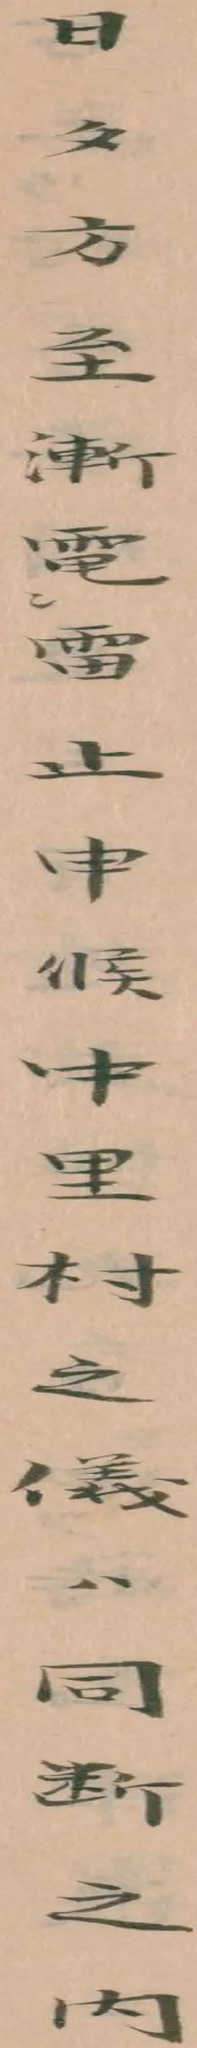日夕方至漸雷電止申候中里村之儀ハ同断之内
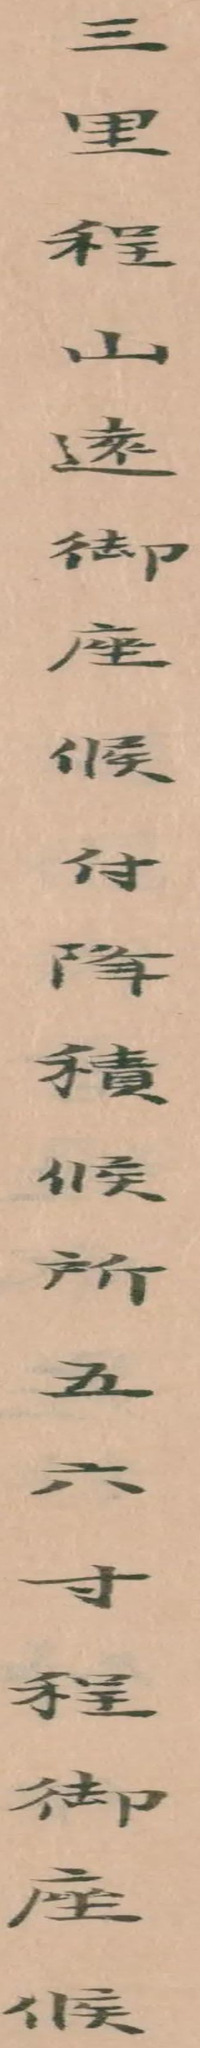三里程山遠御座候付降積候所五六寸程御座候
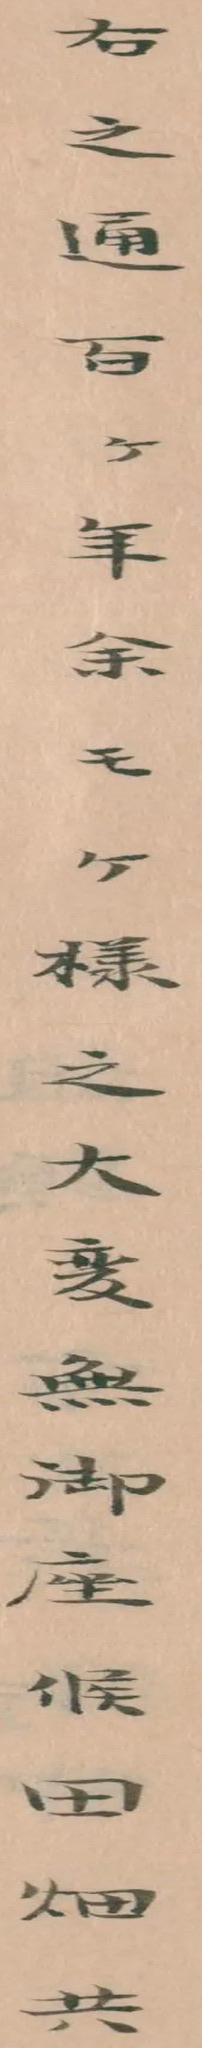右之通百ヶ年余モヶ様之大変無御座候田畑共
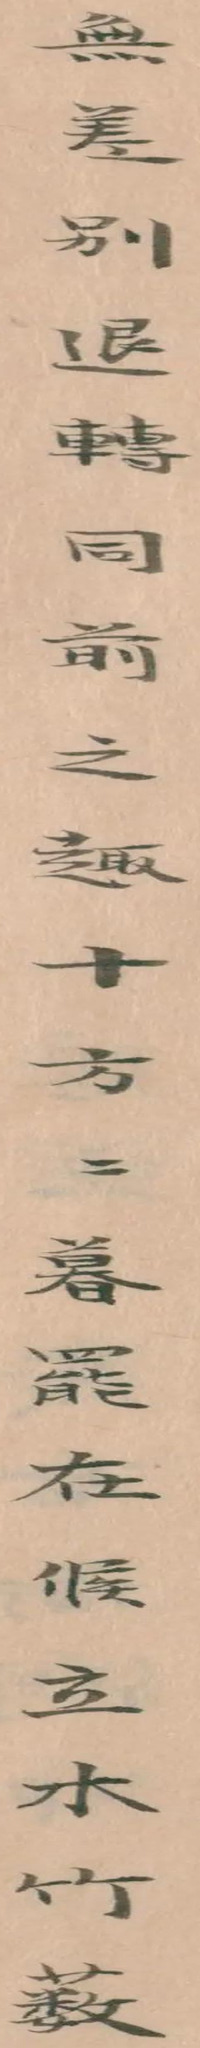無差別退転同前之趣十方二暮罷在候立木竹藪
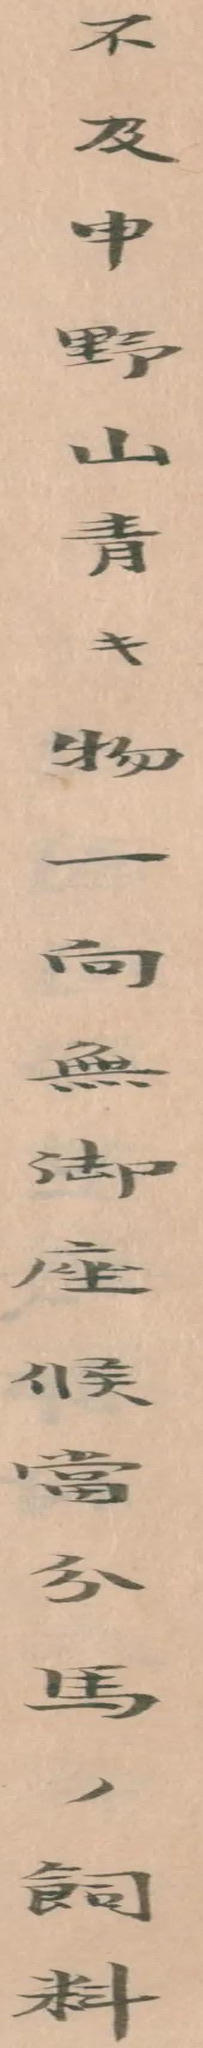不及申野山青キ物一向無御座候当分馬ノ飼料
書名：地災撮要. 巻1(噴火山・地震ノ部)
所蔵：国立国会図書館 National Diet Library, JAPAN
